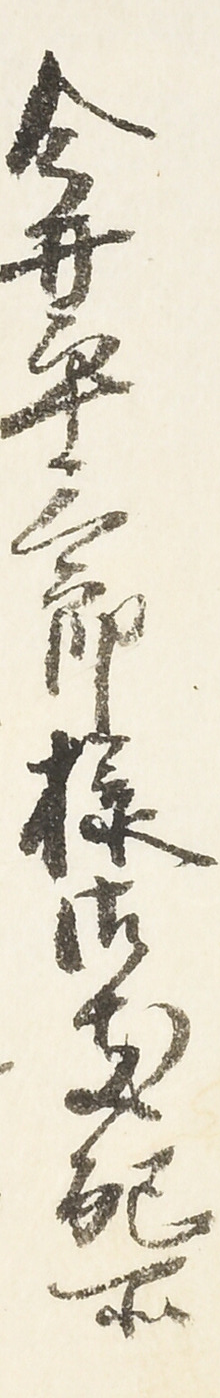今井平三郎様御支配所
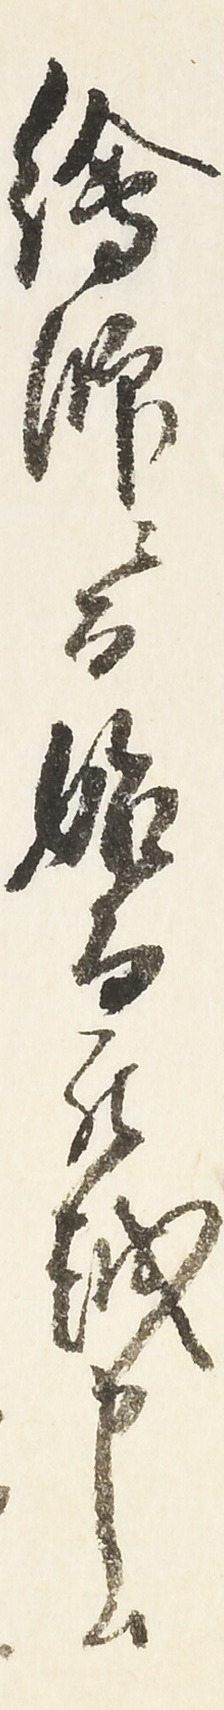絵師ニ而始而罷越申候
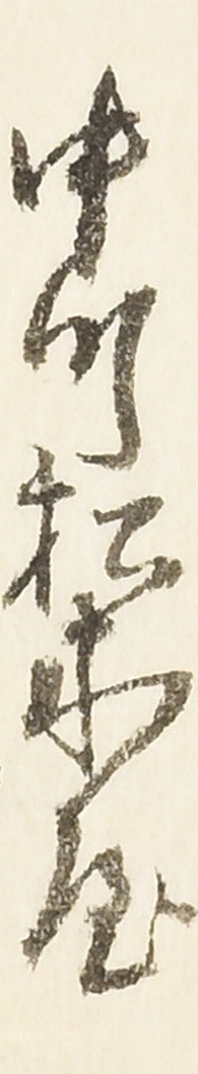中町松木屋
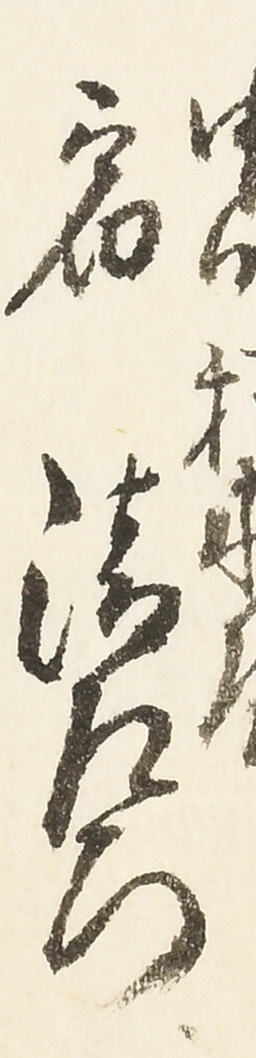宿清左衛門
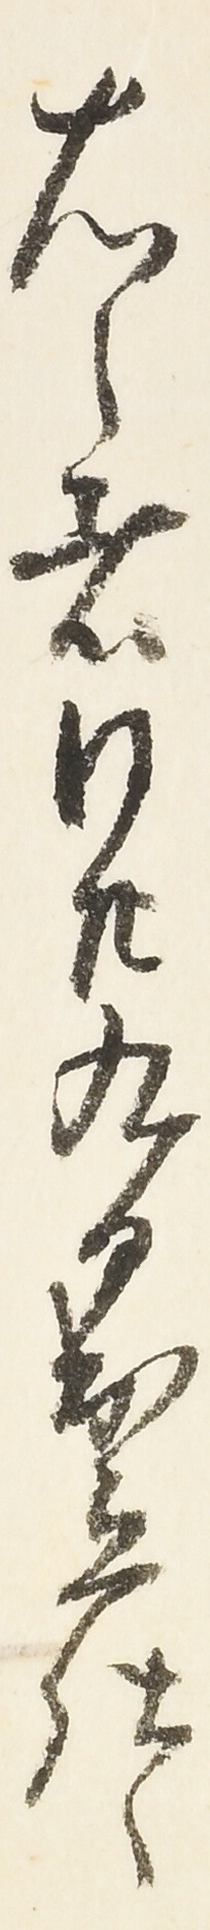右之者同廿九日出立仕候
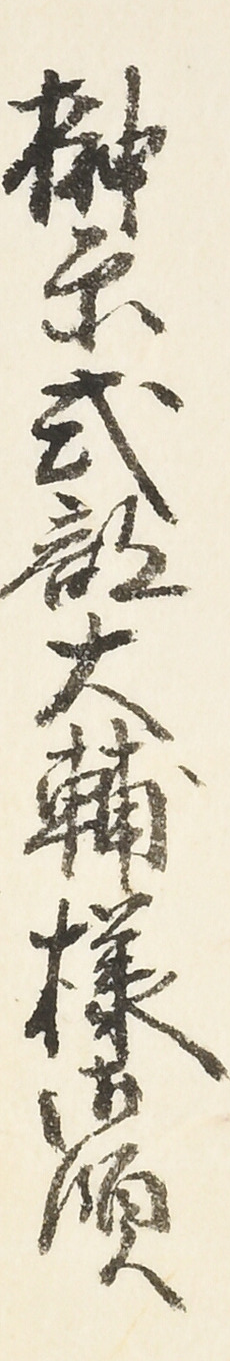榊原式部大輔様御領
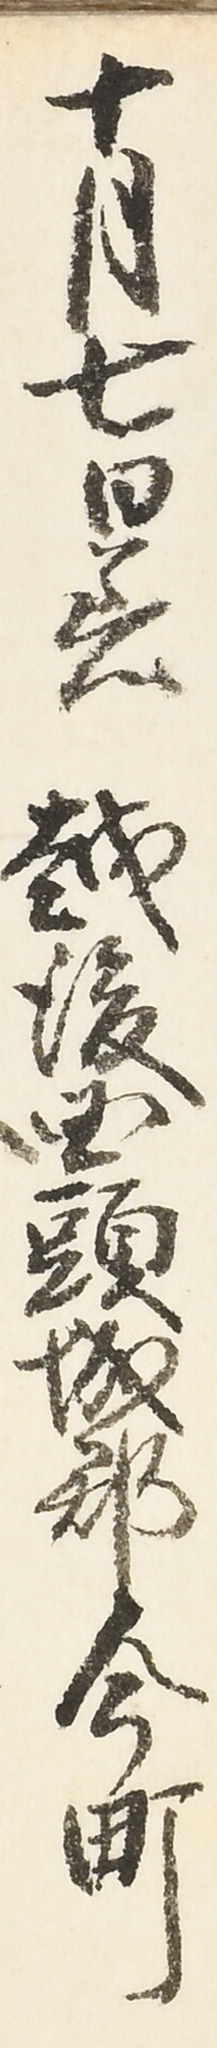十月七日着越後国頸城郡今町
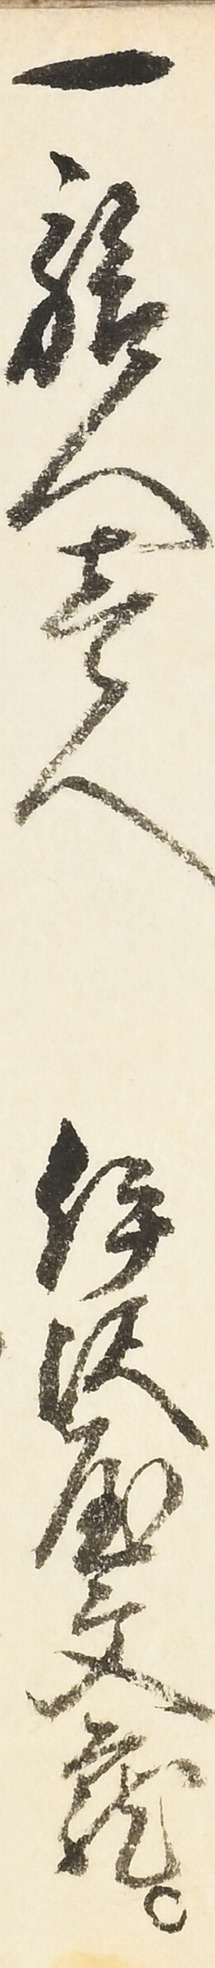一旅人壱人伊沢屋文蔵。
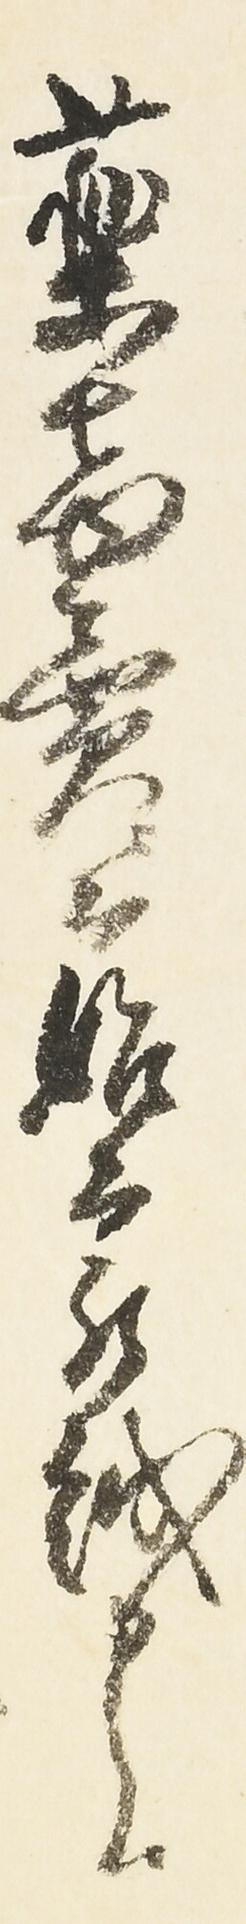薬商売ニ而始而罷越申候
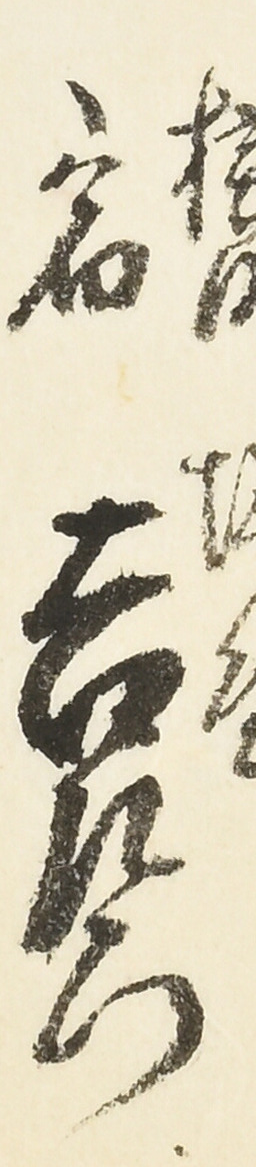宿吉左衛門
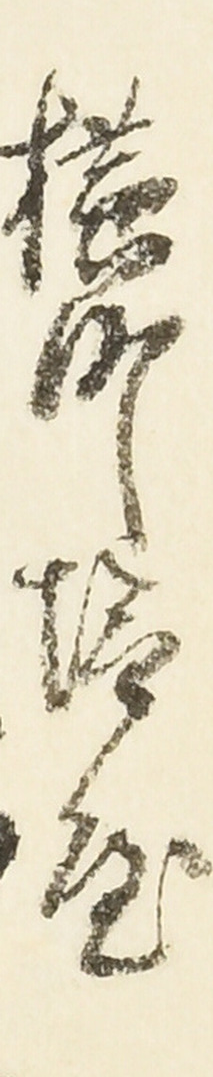横町塩屋
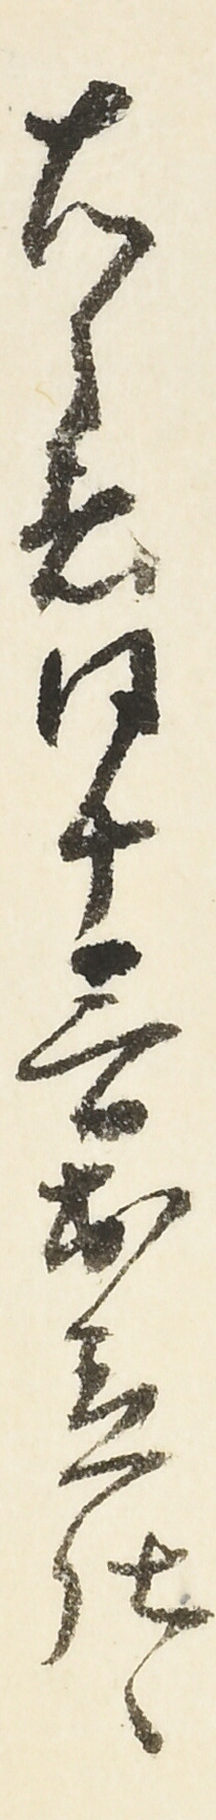右之者同十三日出立仕候
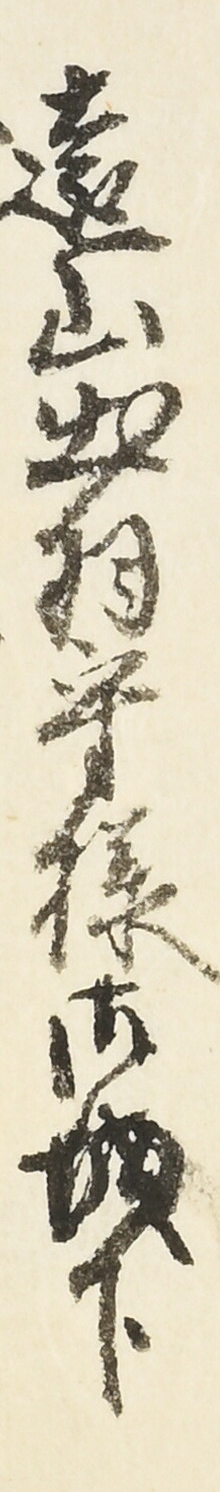遠山出羽守様御城下
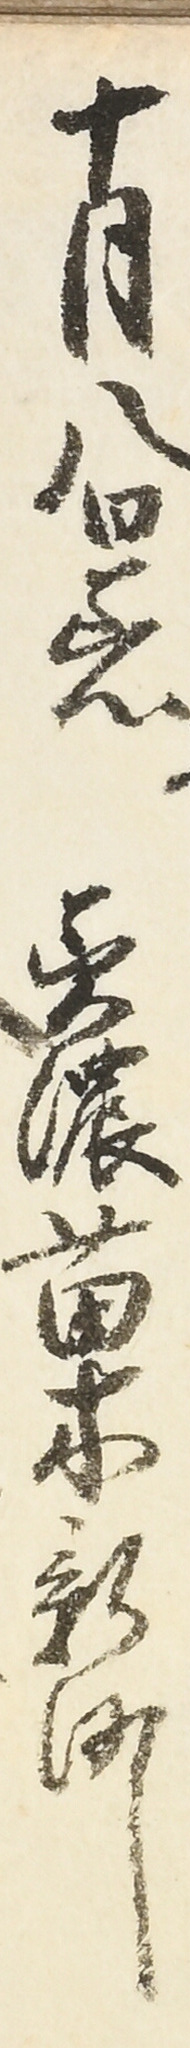十月八日着美濃苗木新町
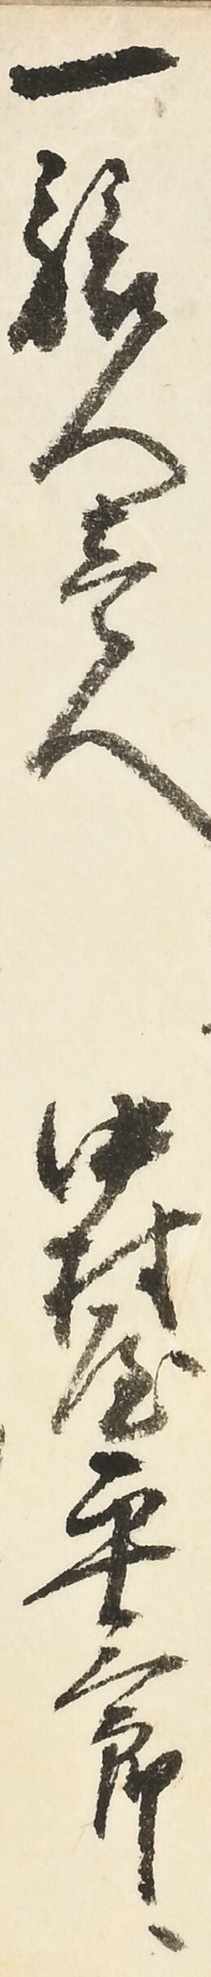一旅人壱人中村屋平三郎、
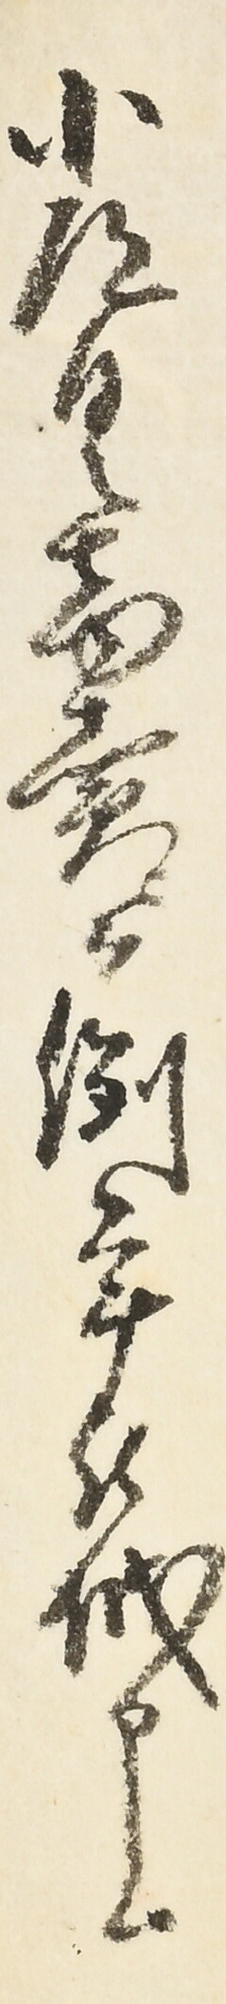小道具商売ニ而例年罷越申候
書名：町中旅人泊控帳
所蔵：伊那市立高遠町図書館・合同会社AMANE
